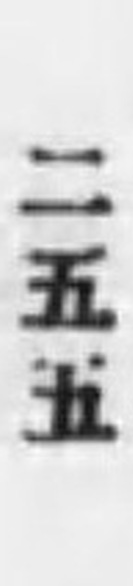二五五

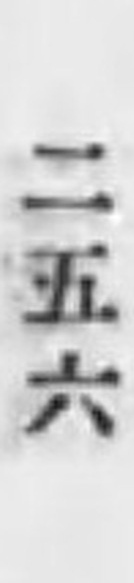二五六
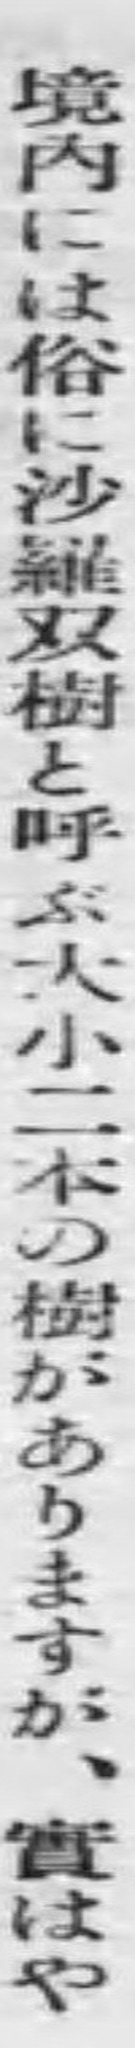境内には俗に沙羅双樹と呼ぶ大小二本の樹がありますが、実はや
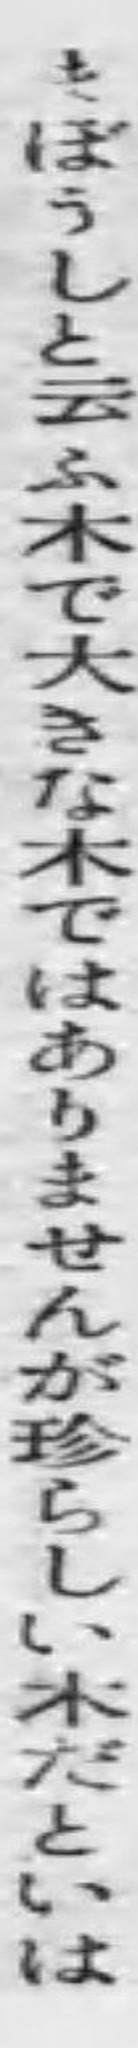まぼうしと云ふ木で大きな木ではありませんが珍らしい木だといは
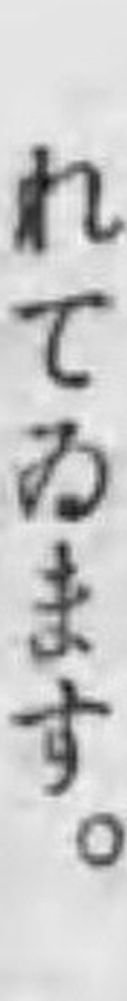れてゐます。
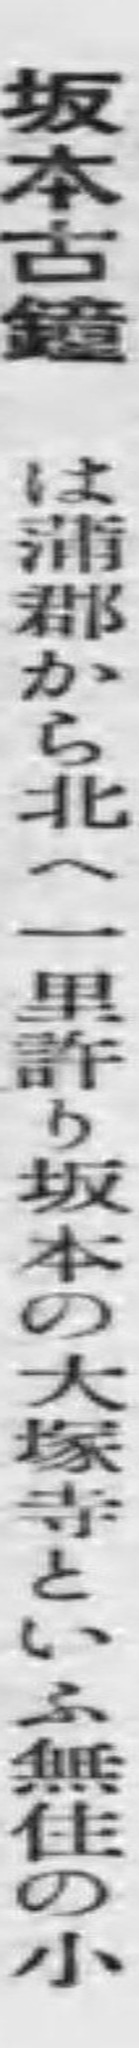坂本古鐘は蒲郡から北へ一里許り坂本の大塚寺といふ無住の小
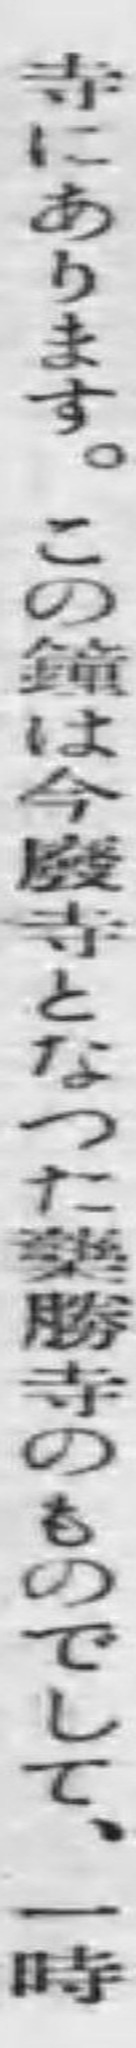寺にあります。この鐘は今廃寺となつた薬勝寺のものでして、一時
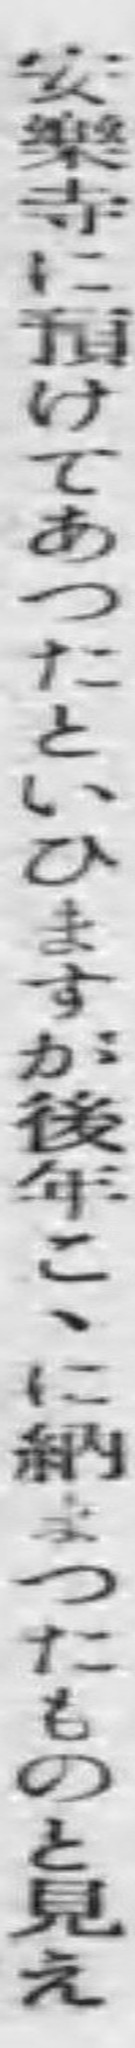安楽寺に預けてあつたといひますが後年こゝに納まつたものと見え
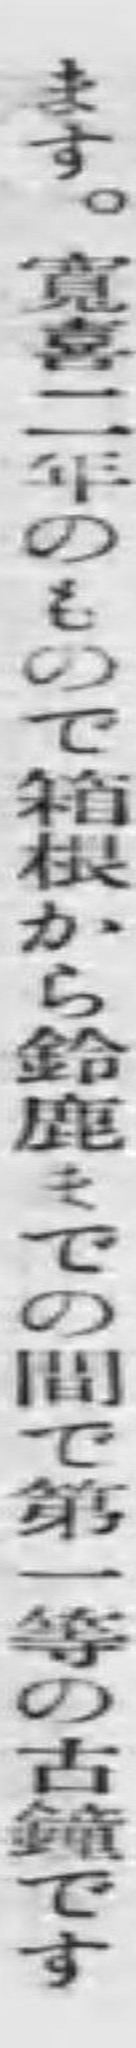ます。寛喜二年のもので箱根から鈴鹿までの間で第一等の古鐘です
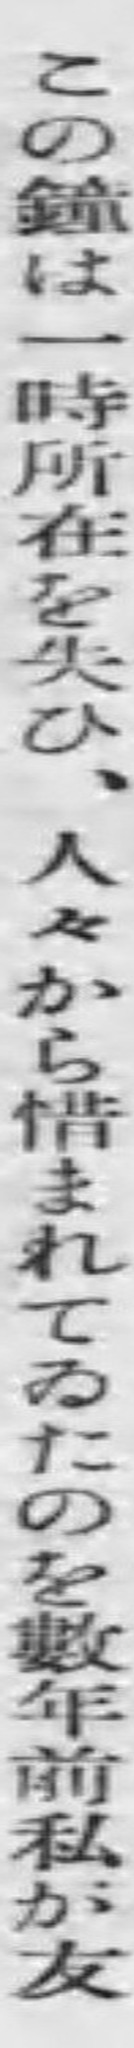この鐘は一時所在を失ひ、人々から惜まれてゐたのを数年前私が友
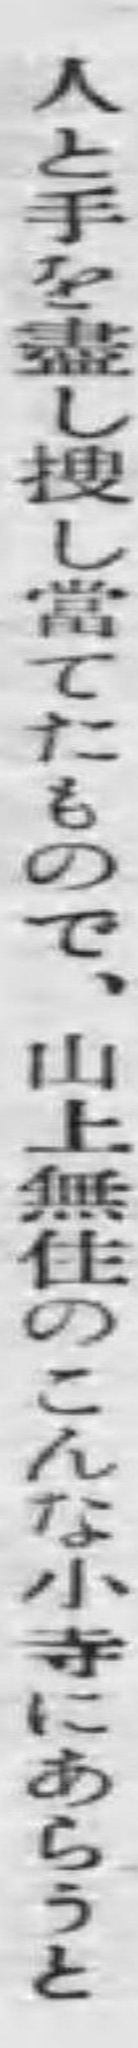人と手を尽し捜し当てたもので、山上無住のこんな小寺にあらうと
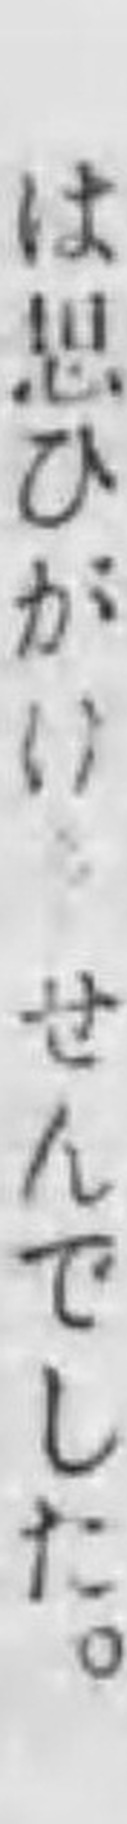は思ひがけせんでした。
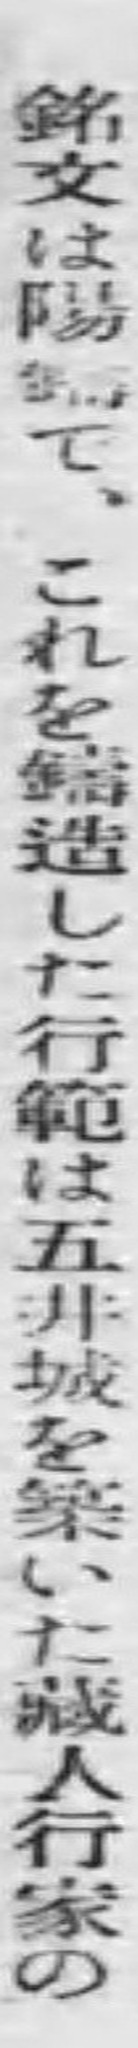銘文は陽鋳で、これを鋳造した行範は五井城を築いた蔵人行家の
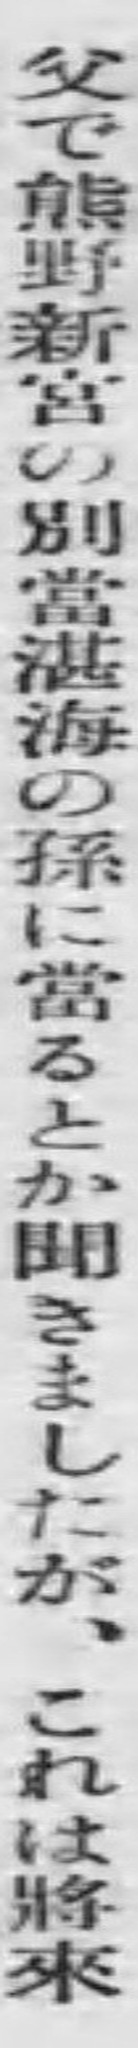父で熊野新宮の別当湛海の孫に当るとか聞きましたが、これは将来
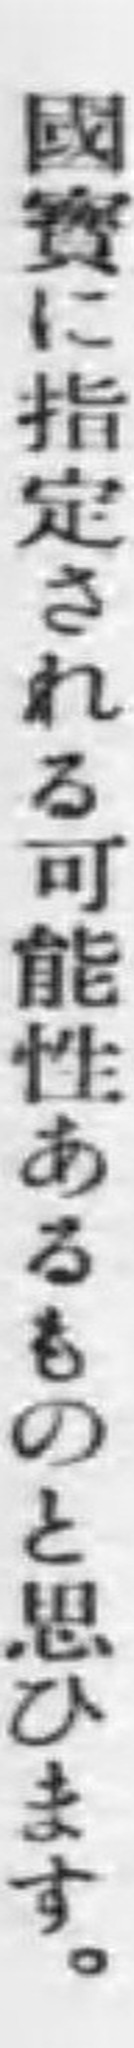国宝に指定される可能性あるものと思ひます。
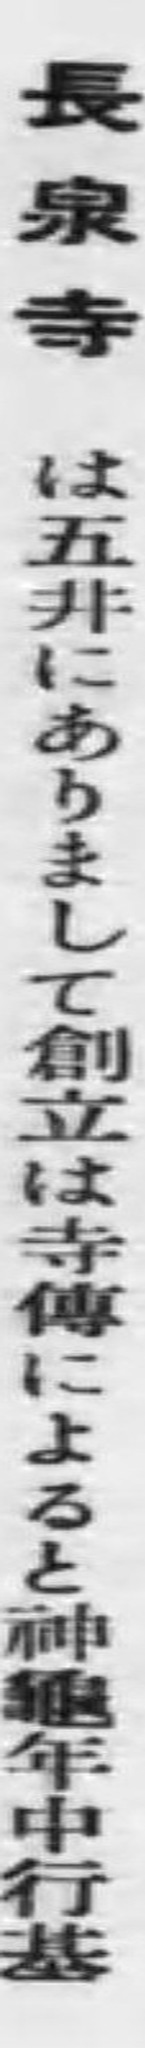長泉寺は五井にありまして創立は寺伝によると神亀年中行基
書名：東三河道中記 : 豊橋市及其附近案内
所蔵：国立国会図書館 National Diet Library, JAPAN
